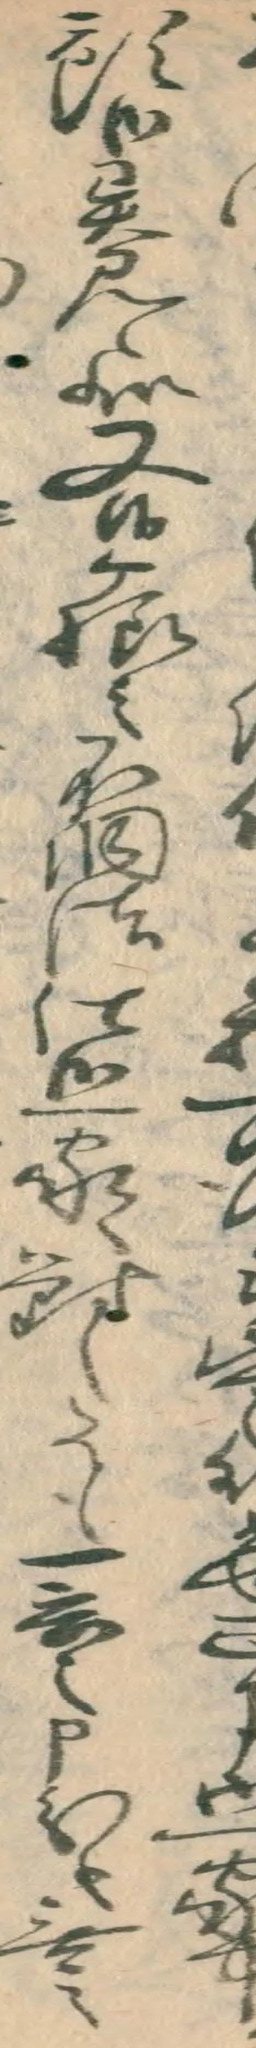預御異見候処又候ケ様之不調法仕御一家へ対し候ても一言之申分も無之
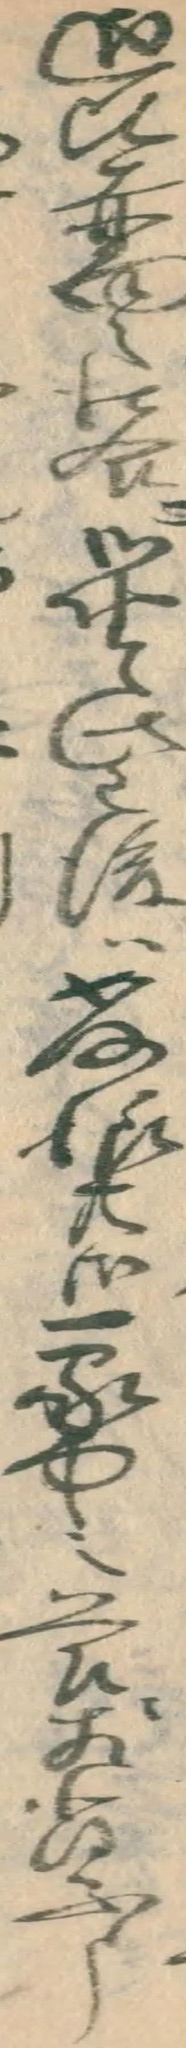近比赤面之仕合ニ御座候此已後ハ如何様共御一家中之思召ニ相背不申
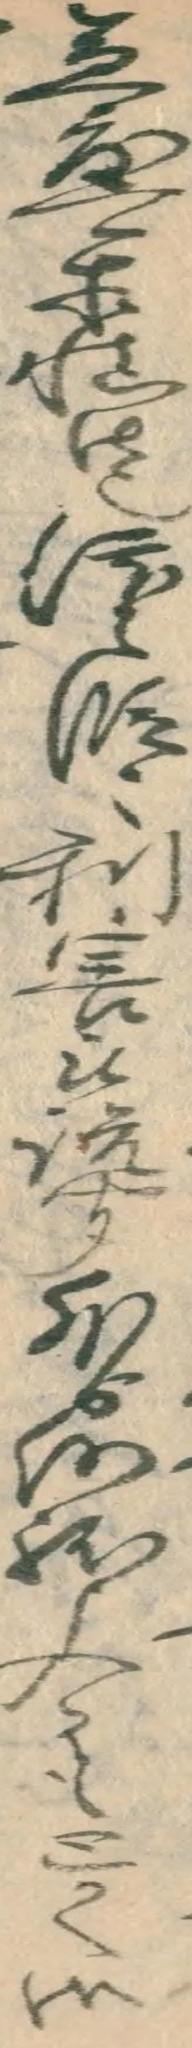急度可相慎由也依之段々利害被説聞外ゟ何程申入候てもとかく御
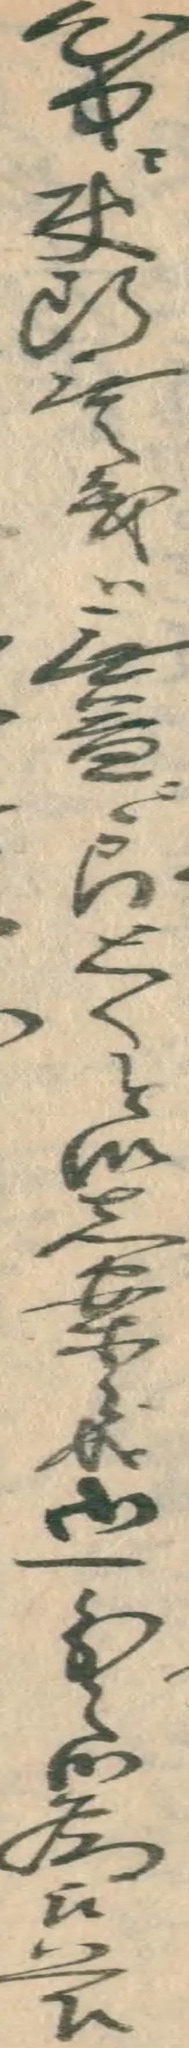心中ニ決断無之義ハ無益ニ候間とくと御志案被成御一分之御為被思召
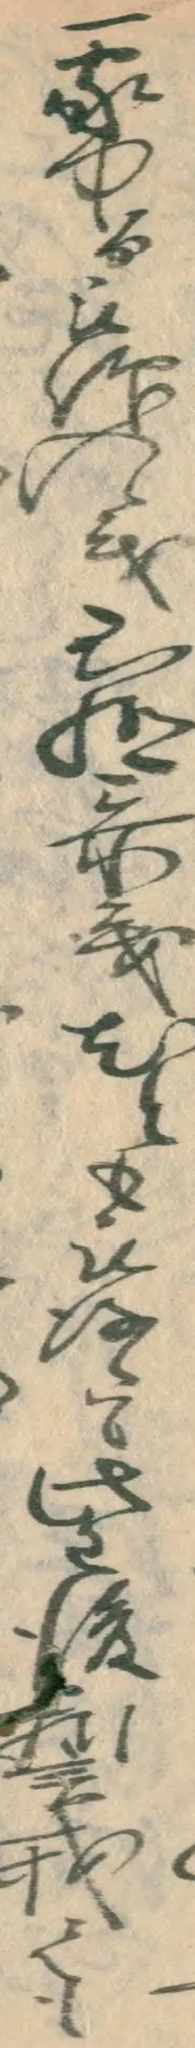一家中ゟ被仰入候義至極忝義尤とも被存候ハヽ此已後誓戒ニても
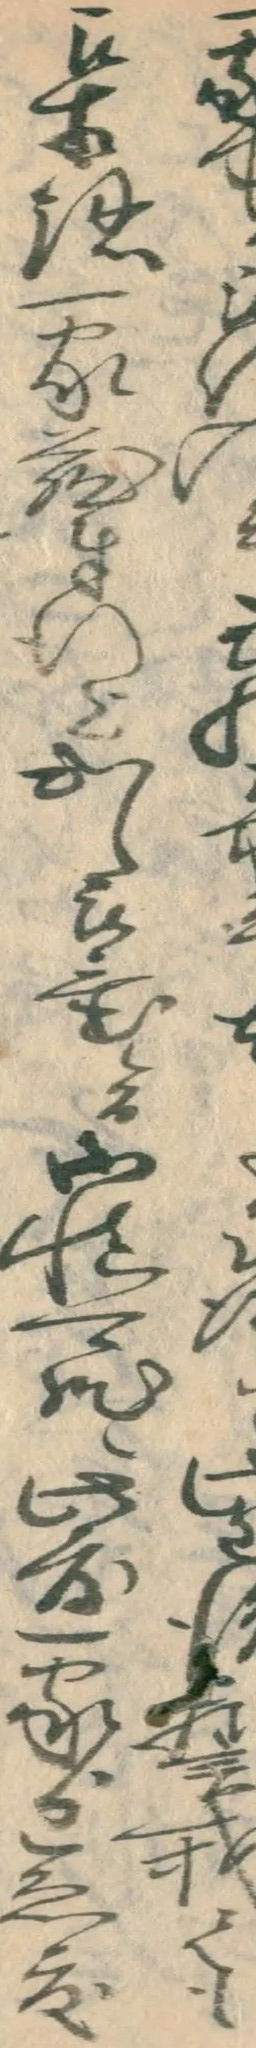被相認一家蔵奉行迄出し被置候而御慎可然候此度一家ゟ急度
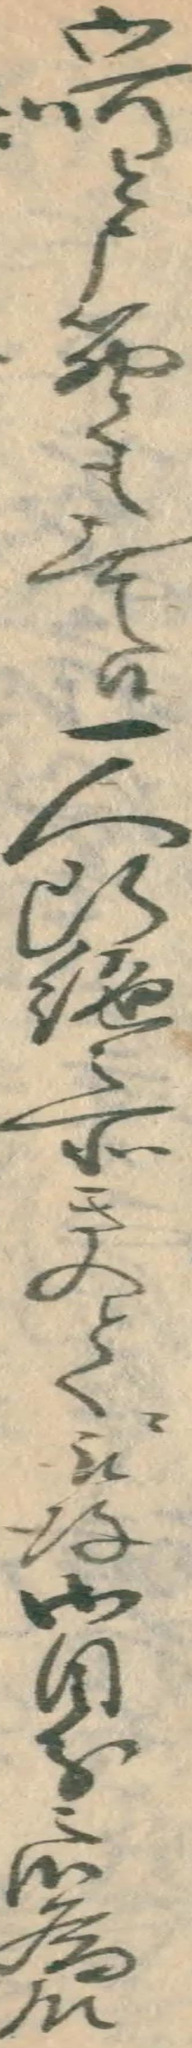御呵と申筋にても無之候一人断絶之所きのとくニ被存御自分之御為故
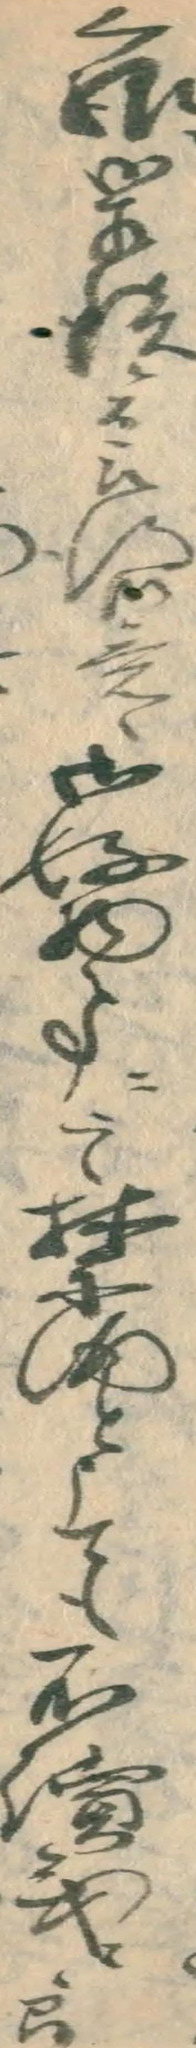ケ様ニ御相談ニ而被得御意候御好物之事ニ候ハヽ禁酒と申ても不続義ニ候間
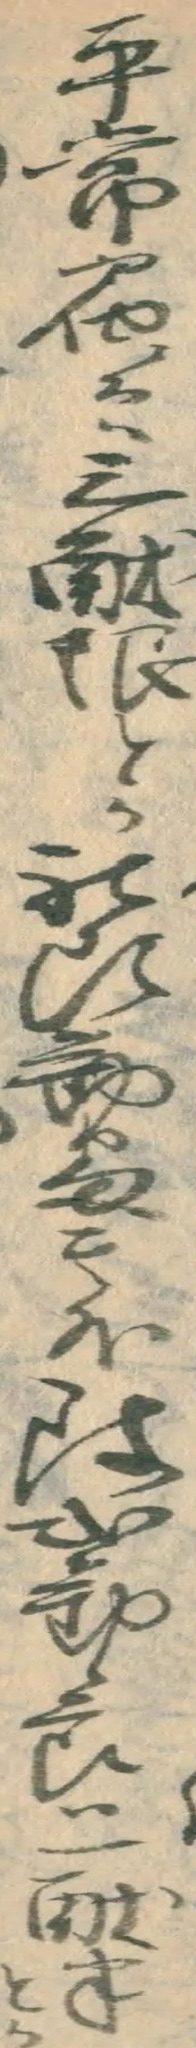平常宿ニ而ハ三献限とか社頭勤番其外致出勤候節ハ一献半とか
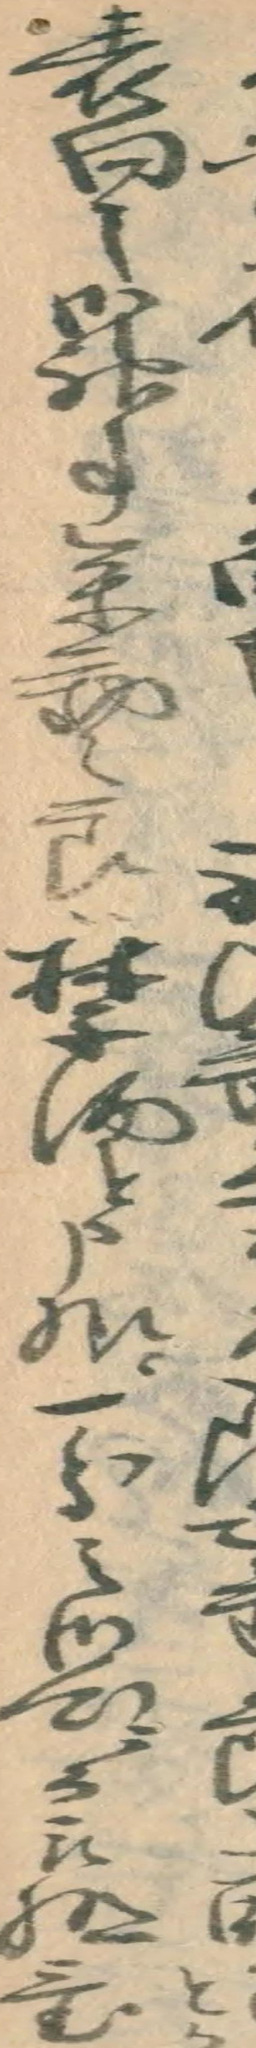表向之御神事参勤之節ハ禁酒と申様ニ一分之御心ニ而被極置

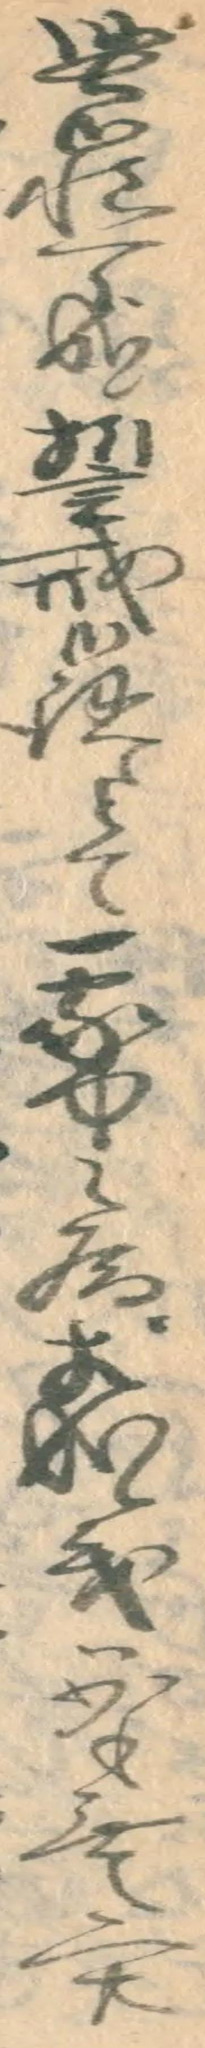堅御慎可被成候誓戒御認候とて一家中之為ニ相成候義ハ少も無之候へ共
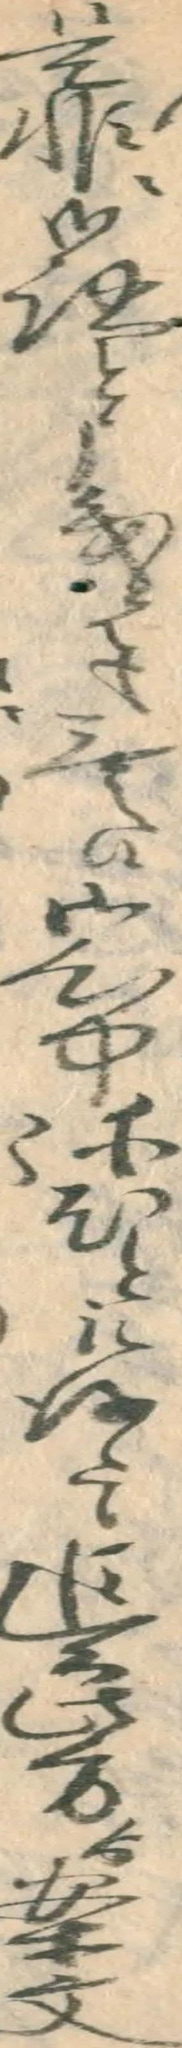是非ニ御認と申義ニても無之候御心中弥尤と被存候ハヽ追而此方ゟ案文
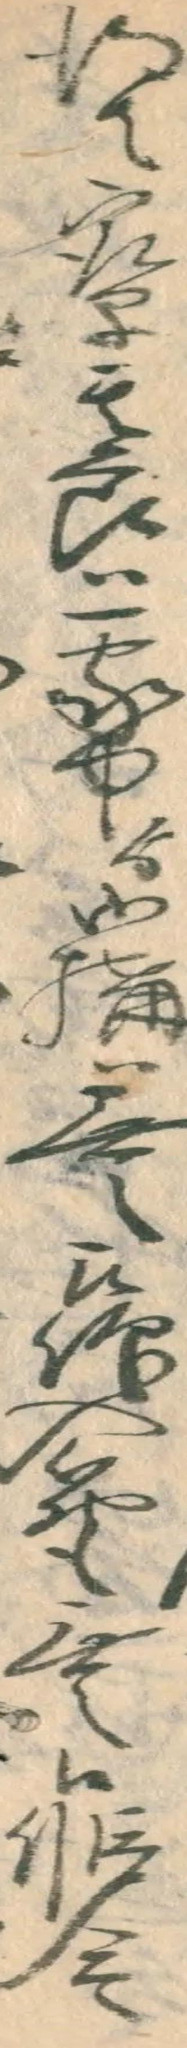得者最早其節ハ一家中ゟ御構ハ無之被仰入筋も無之候仮令
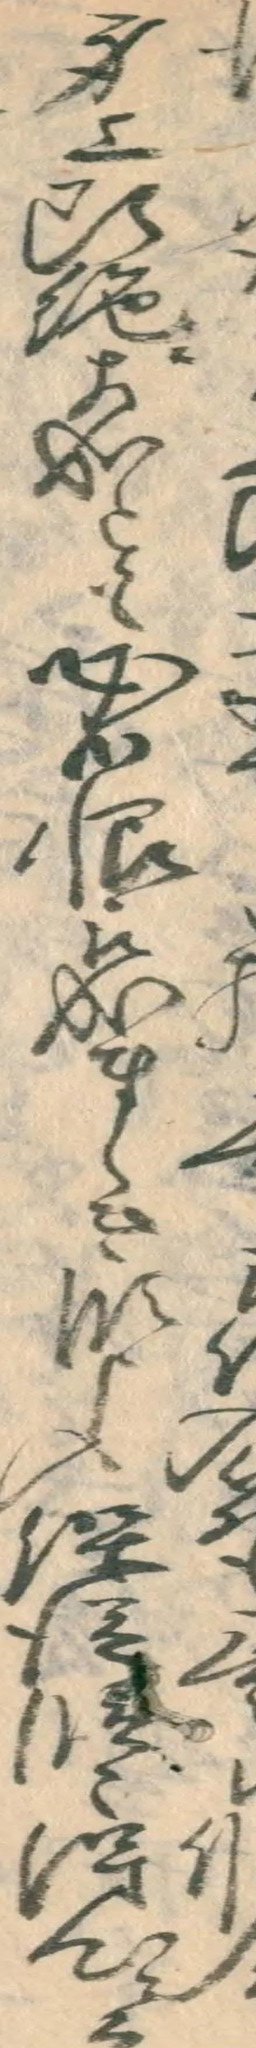身上断絶ニ相成候とも必御恨被成ましき段申入保従段々得心ニ而
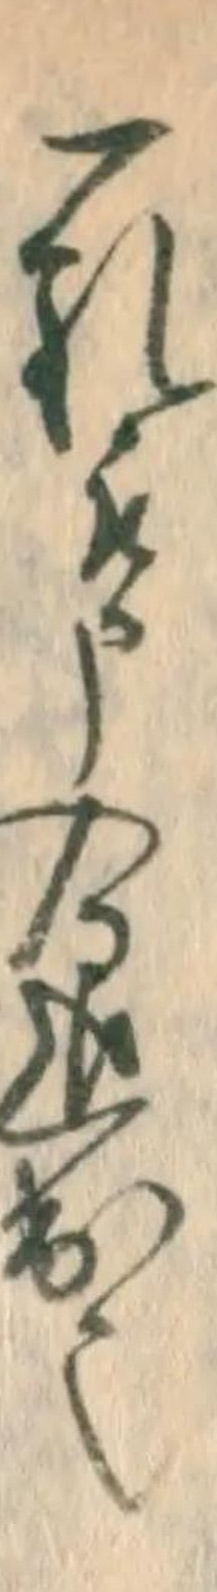一礼被申入退出也
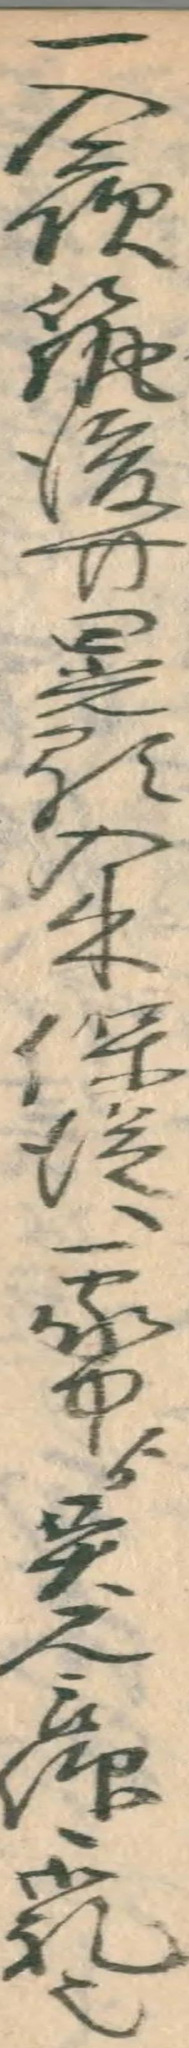一入夜筑後介晃顕入来保従へ一家中ゟ異見被仰候御礼也
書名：賀茂社記録. 第58冊
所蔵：国立国会図書館 National Diet Library, JAPAN
